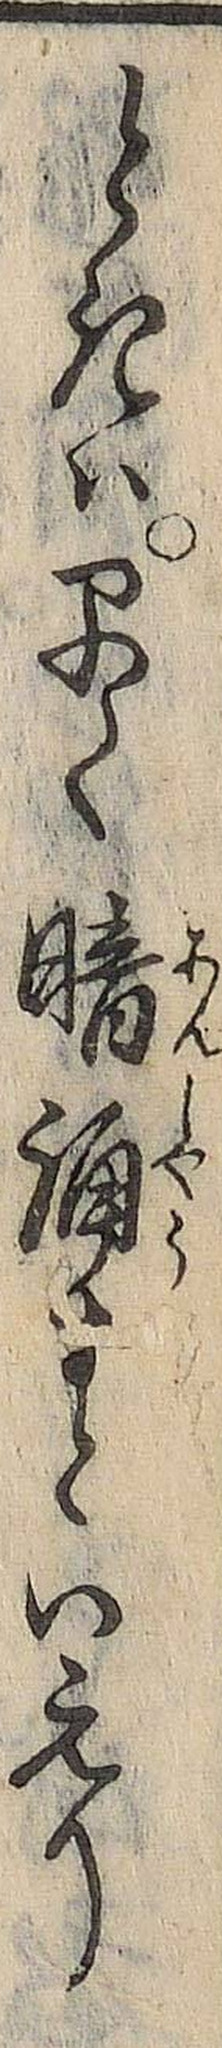ときは。早々暗誦すといえり
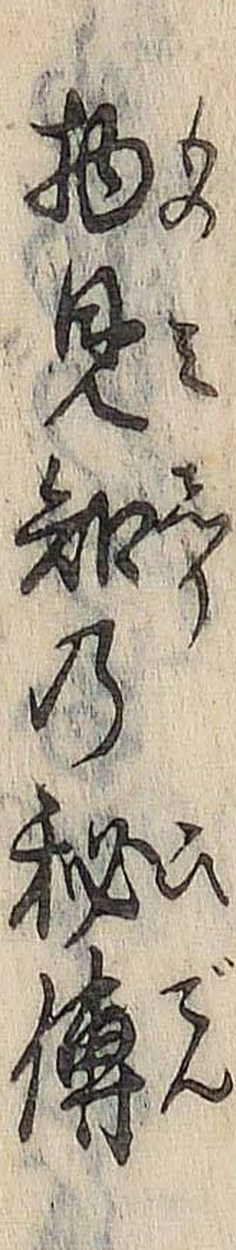物見知の秘伝
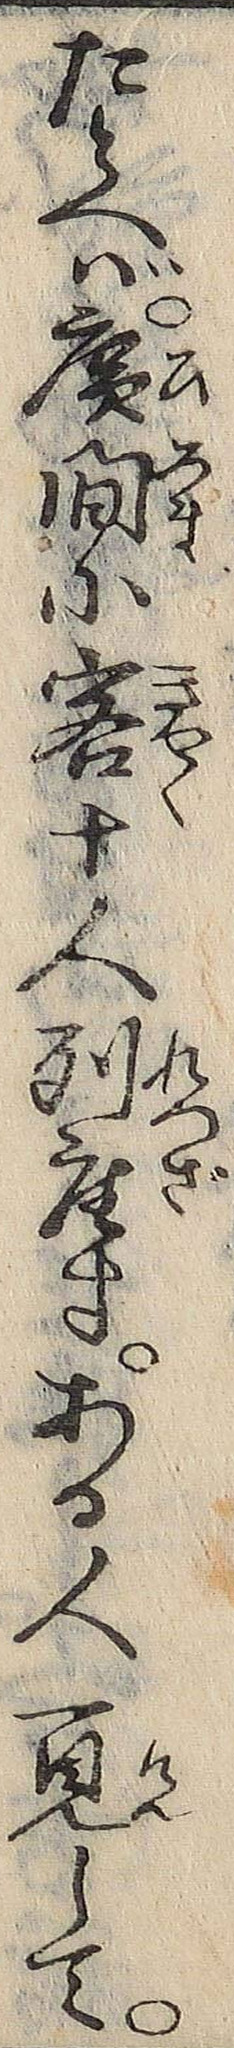たとへば。広間に客十人列座す。ある人一見して。
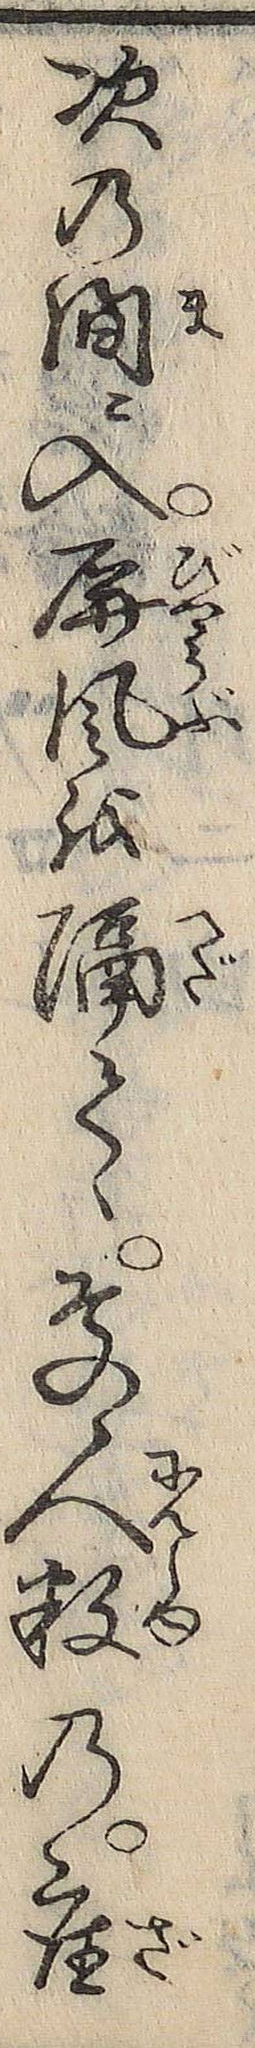次の間に入。屏風を隔てゝ。その人数の。座
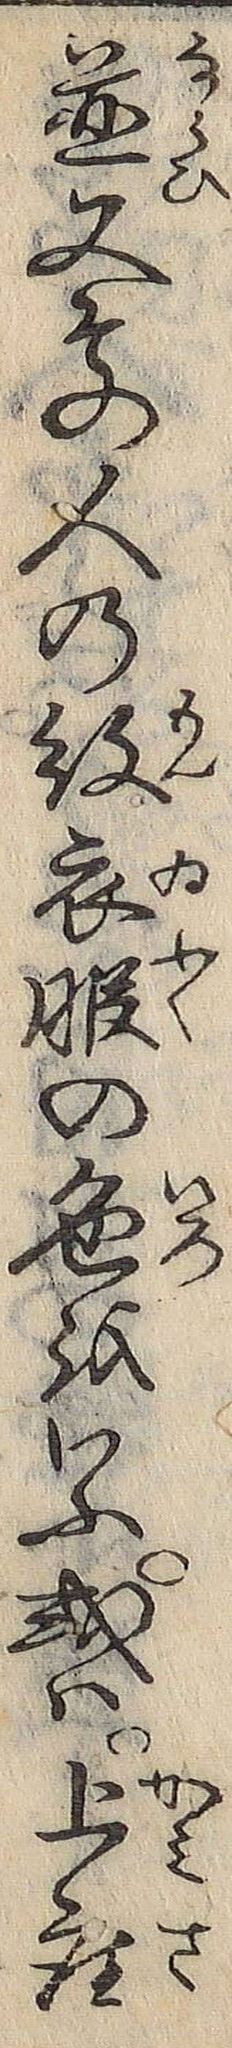並又その人の紋衣服の色をいふ。或は。上座
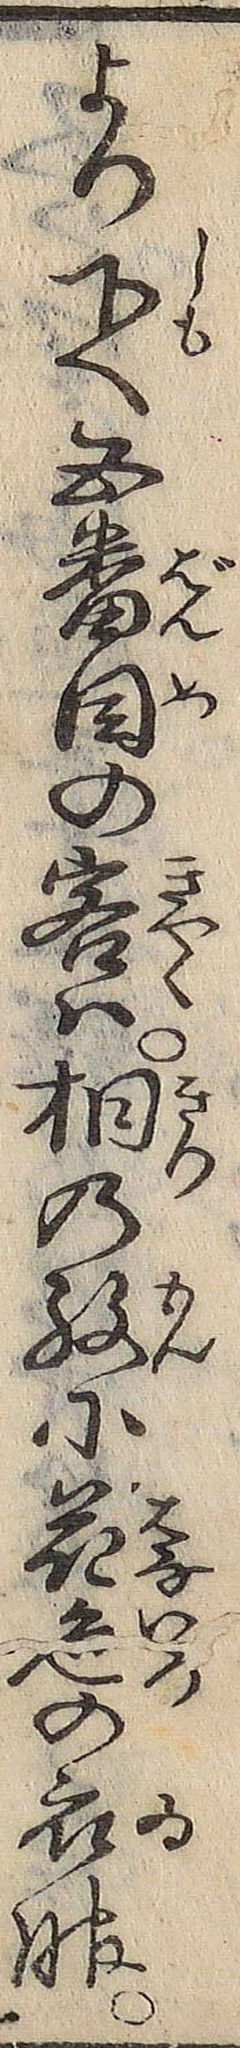より下へ五番目の客は。桐の紋に花色の衣服。
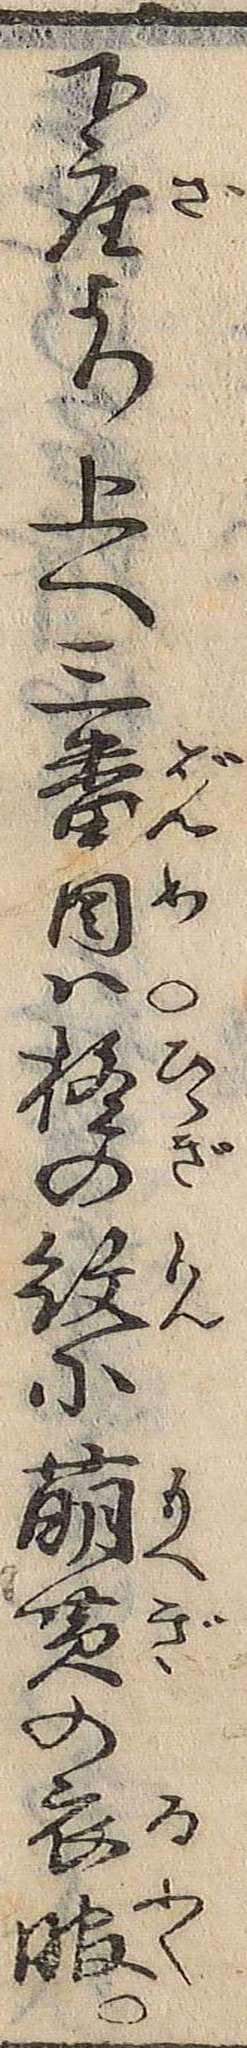下座より上へ三番目は。柊の紋に萌黄の衣服。
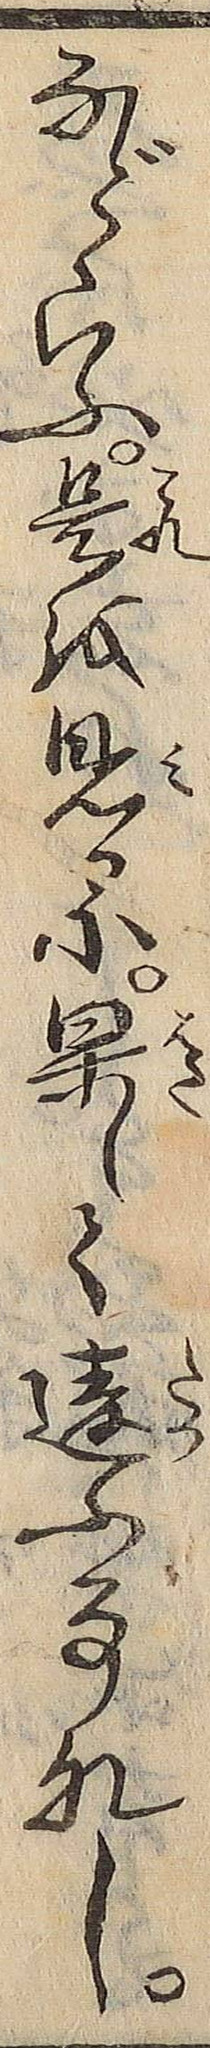などゝいふ。是を見るに。果して違ふる事なし。
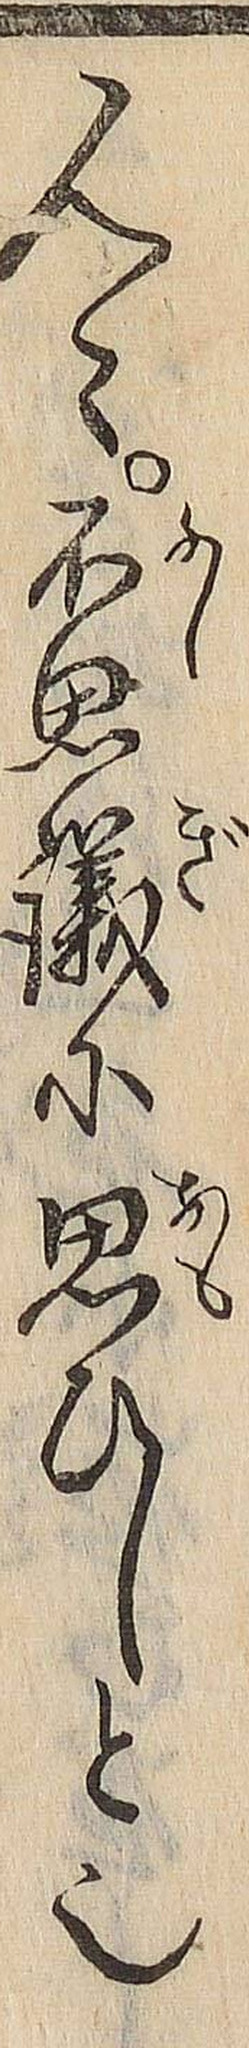人々。不思議に思ひしと也
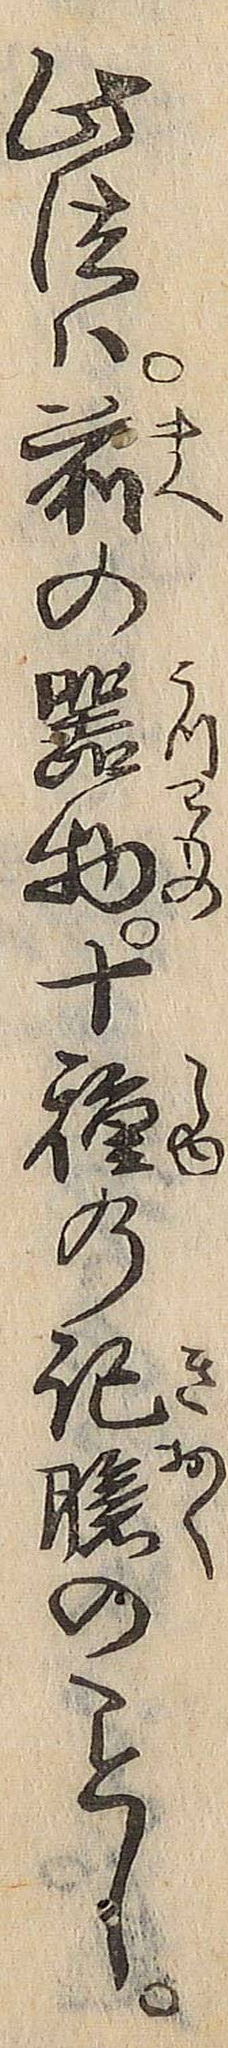此法は。前の器物。十種の記臆のことし。
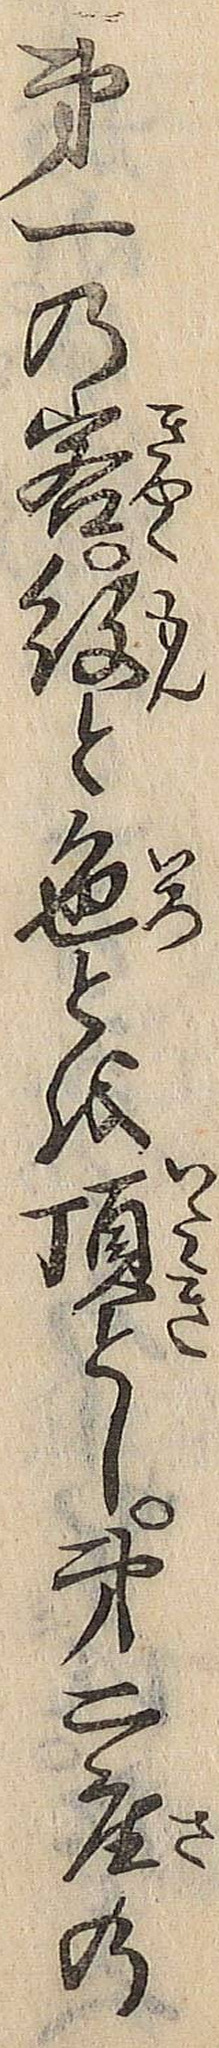第一の客。紋と色とを頂とし。第二座の
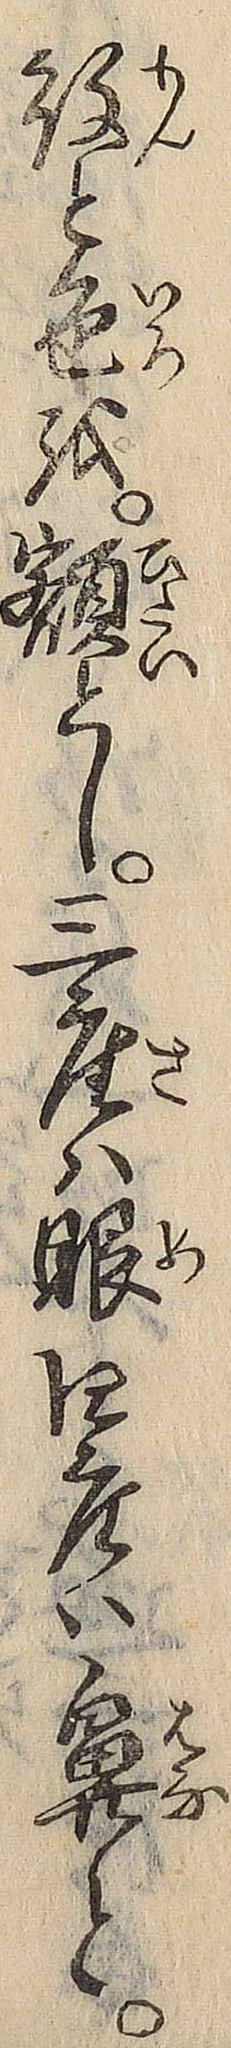紋と色を。額とし。三座は眼四座は鼻と。
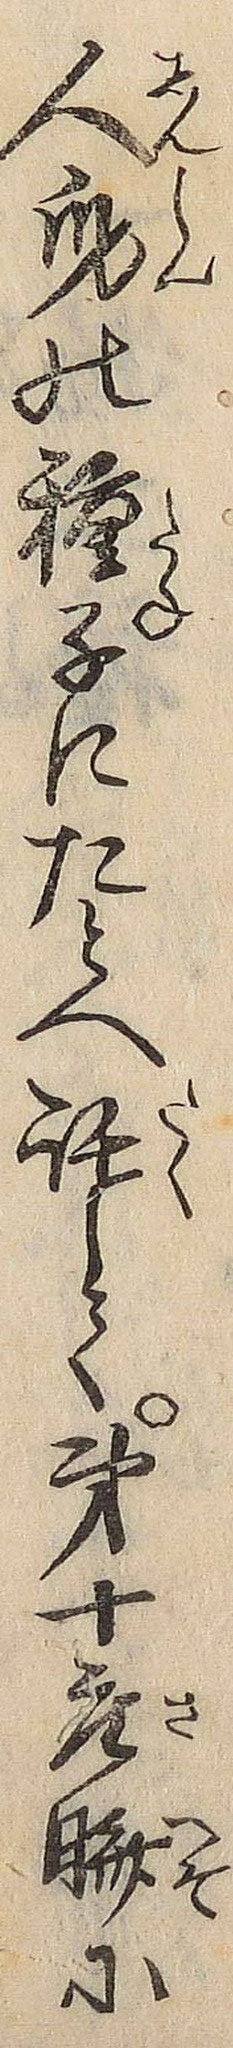人身の種子にたとへ託して。第十座臍に
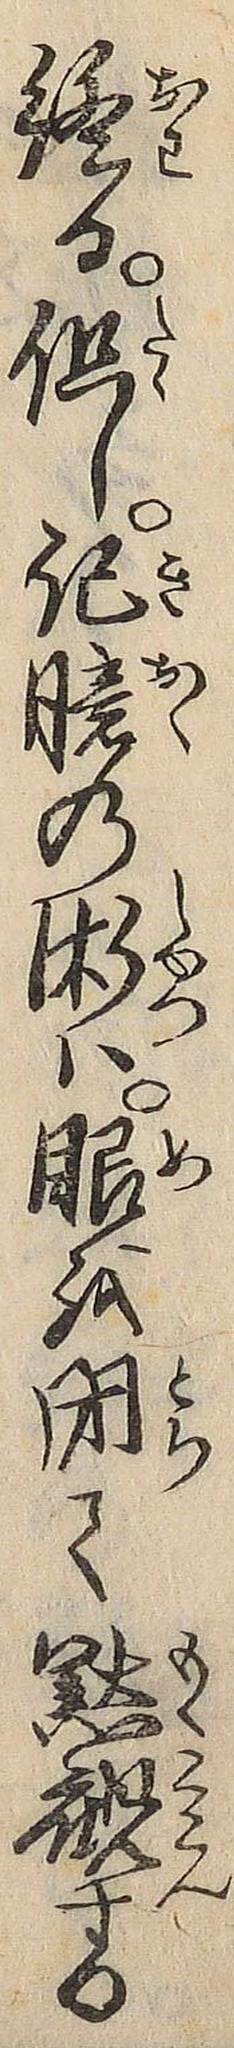終る。但し。記臆の術は。眼を閉て黙観する
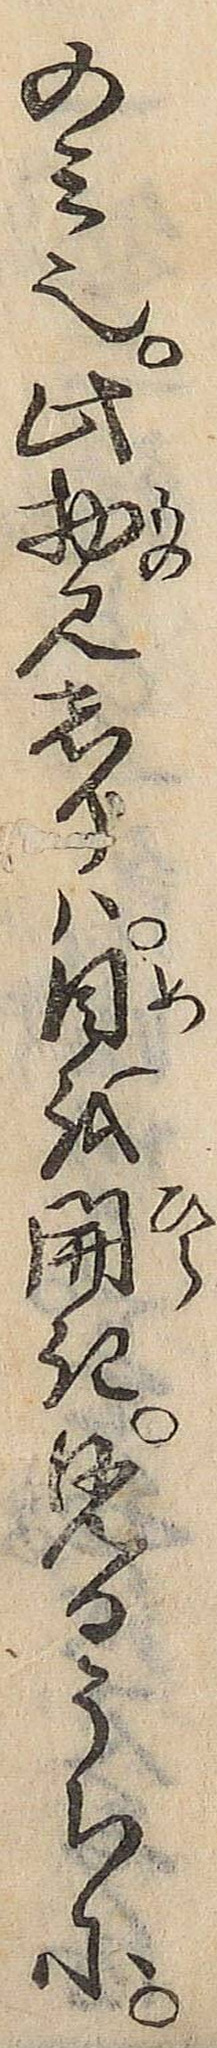のみ也。此物見しりは。目を開き。見るうちに。

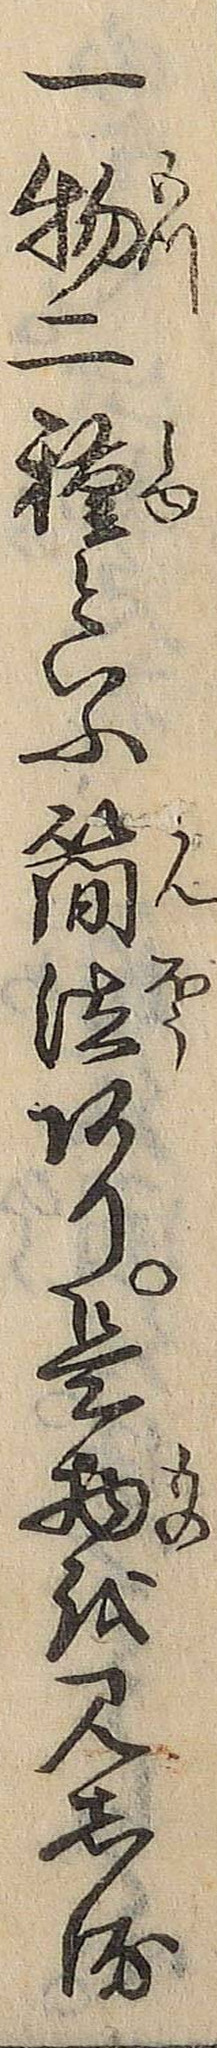一物二種といふ簡法あり。是物を見しる
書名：物覺秘傳
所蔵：神戸大学附属図書館 国文学研究資料館
